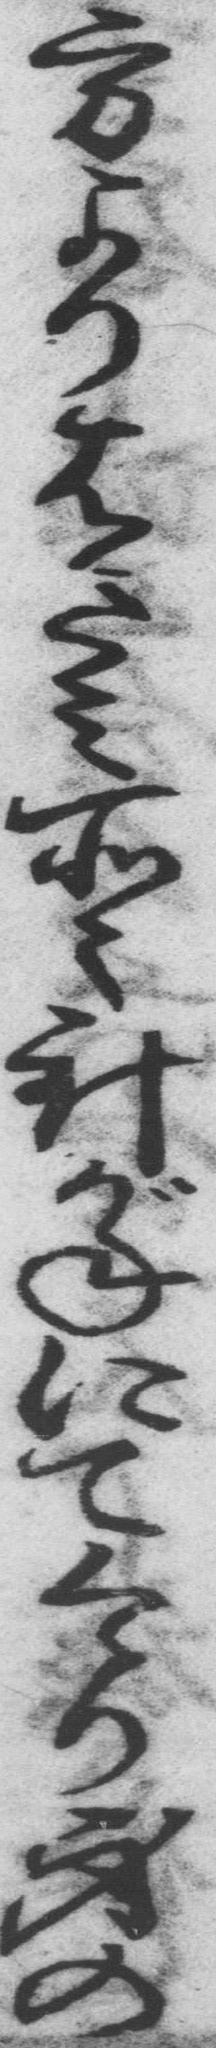方よりはさみ所々針がねにてくゝり身の
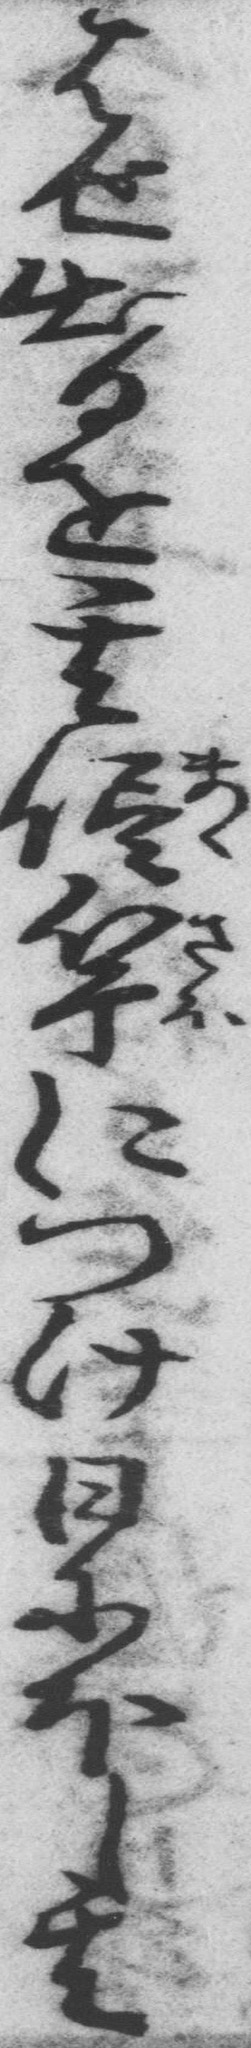はせ出るを其侭竿につけ日にほし其
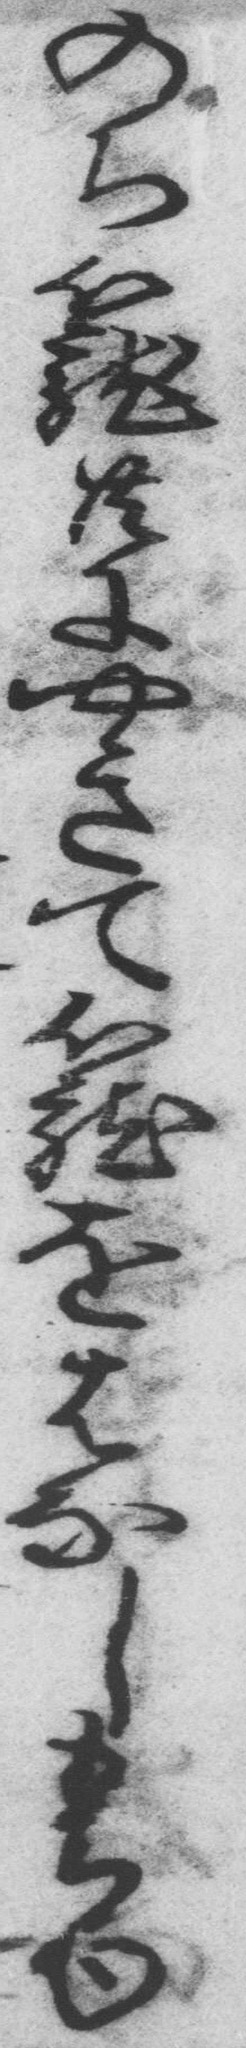のち籠共にやきて籠をはなしもちゆ
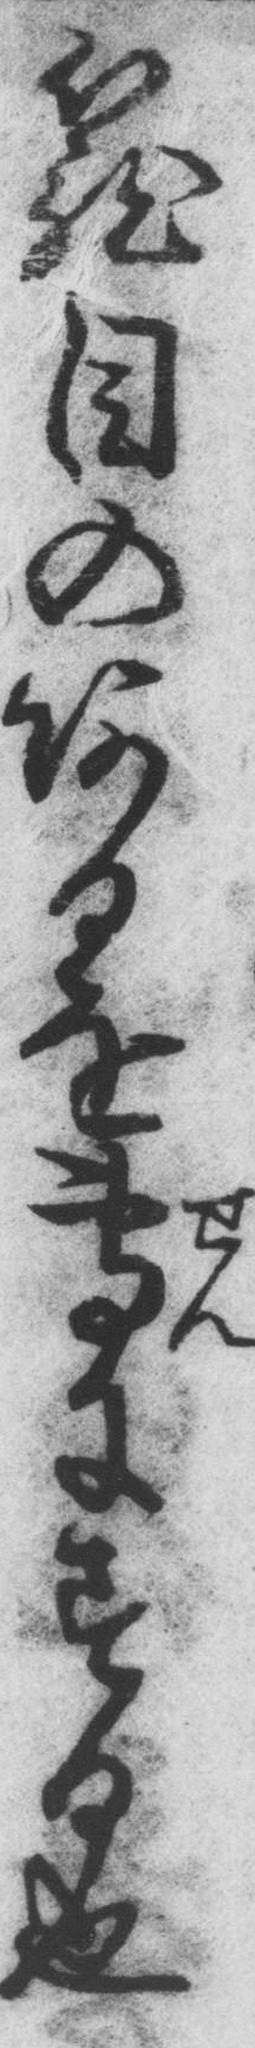籠目のあるを専にする也
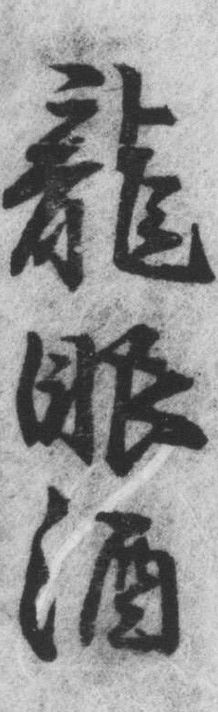龍眼酒
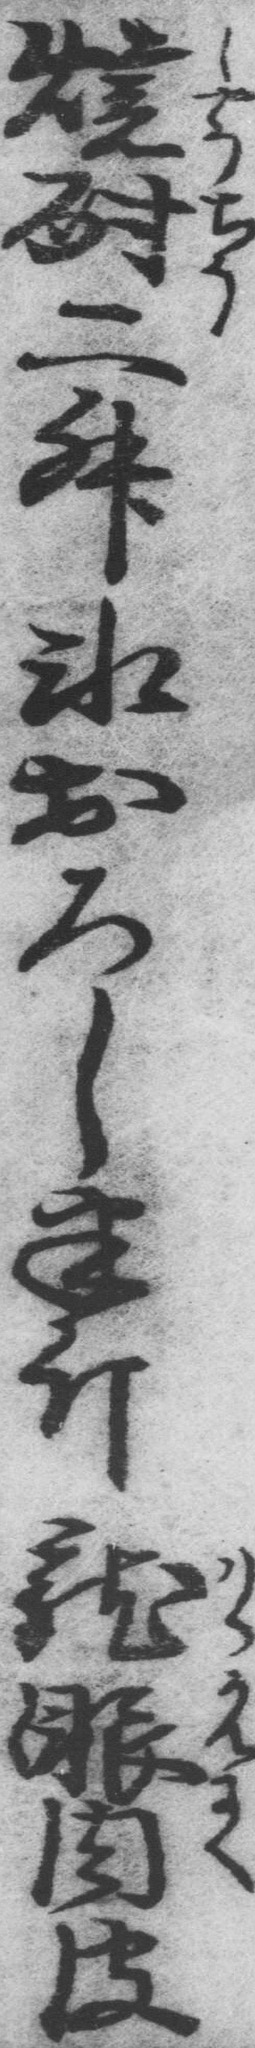焼酎二升氷おろし半斤龍眼肉皮
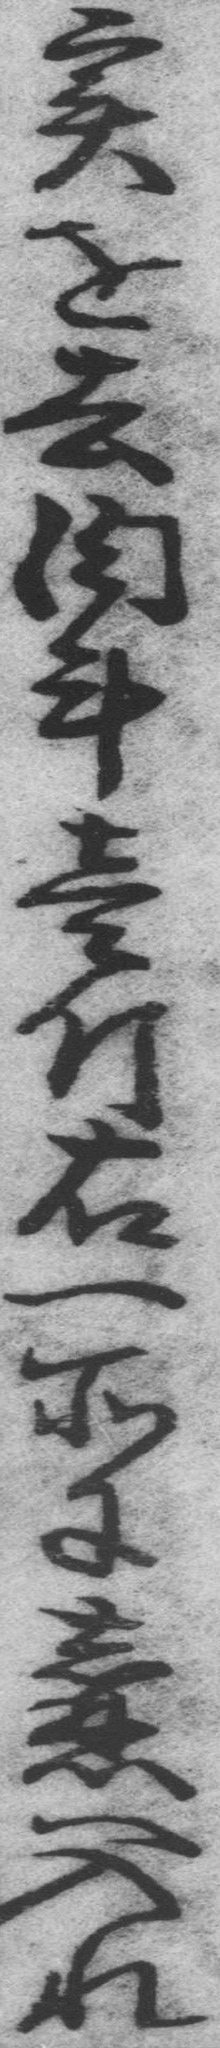実を去肉斗壱斤右一所に壺へ入れ

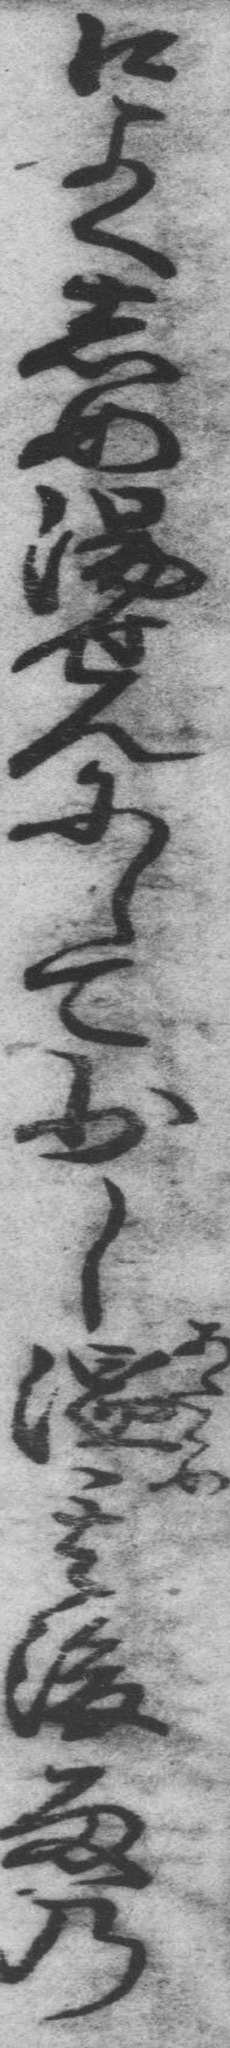口よくしめ湯せんにして少し温其後雨の
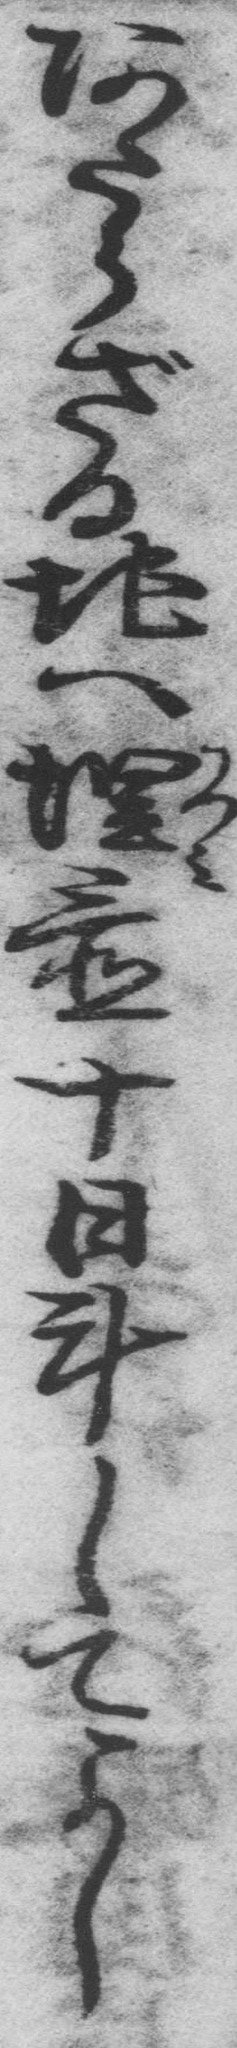あたらざる地へ埋置十日斗してよし
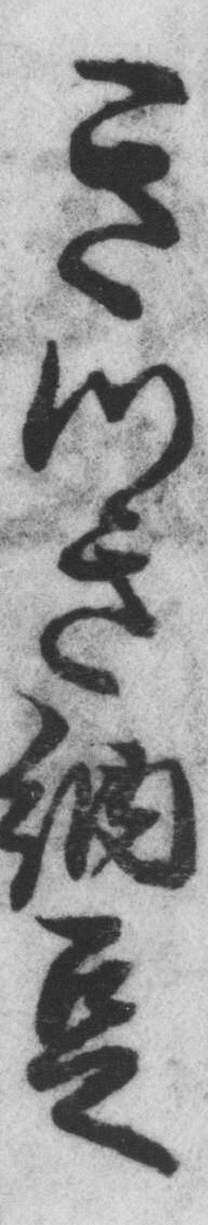きつき納豆
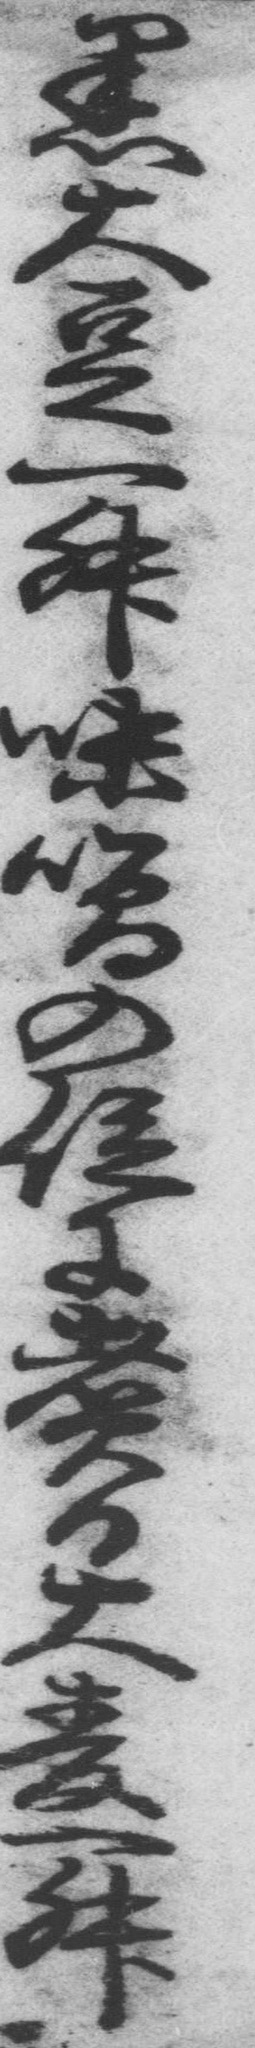黒大豆一升味噌の位に煮る大麦一升
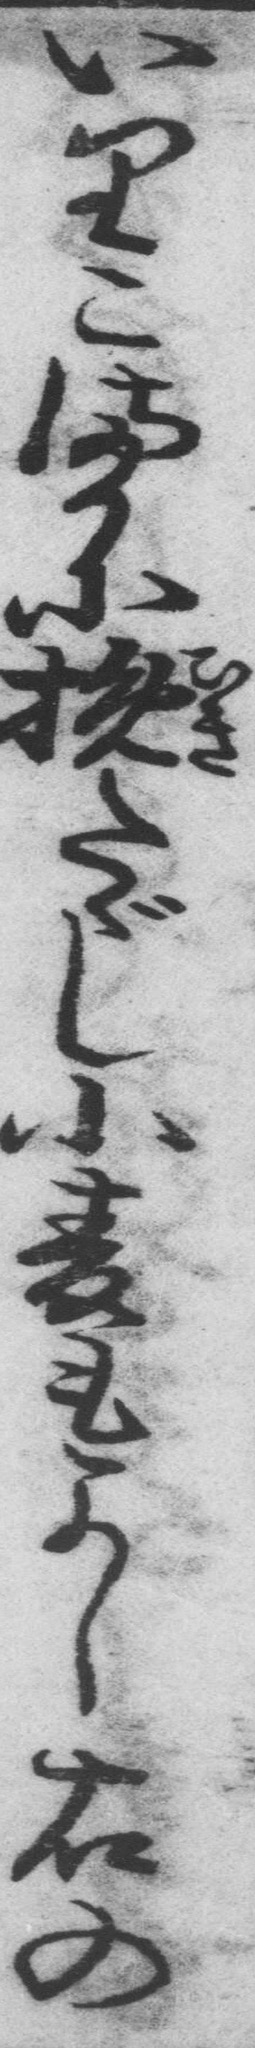いりこまかに挽たゞし小麦もよし右の
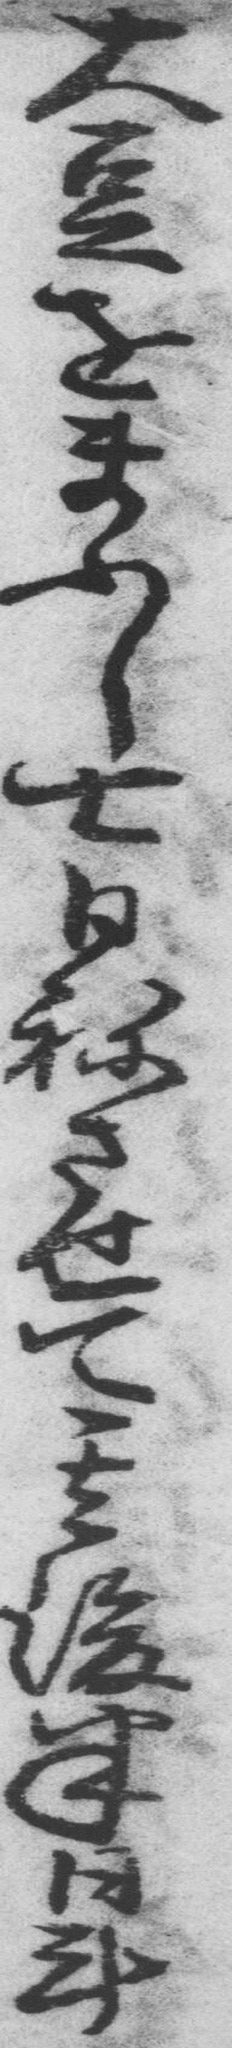大豆をまふし七日ねさせて其後半日斗
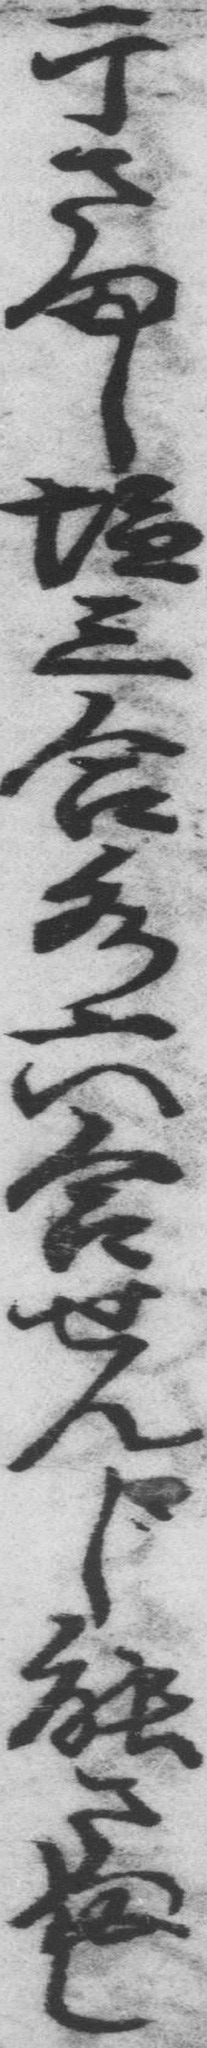干さまし塩三合水六合せんじ能さまし
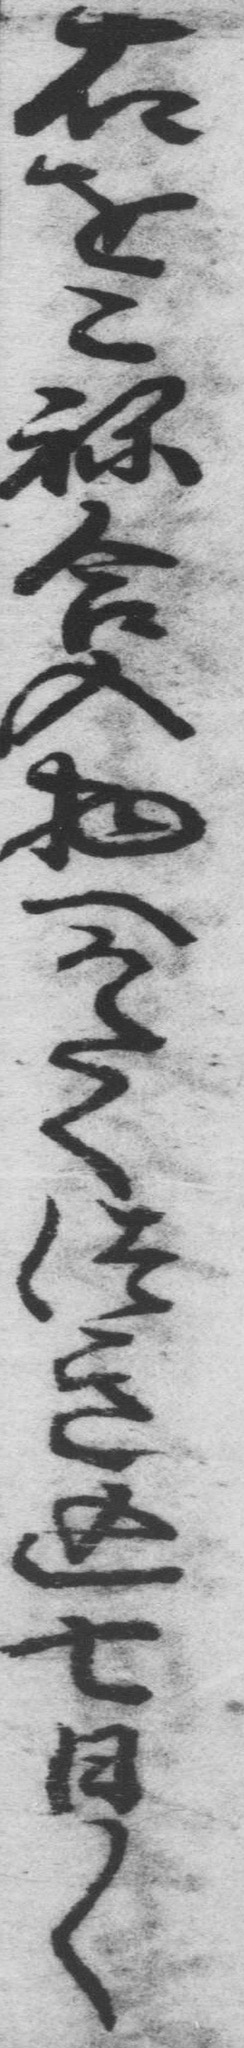右をこね合入物かたくつき込七日〳〵
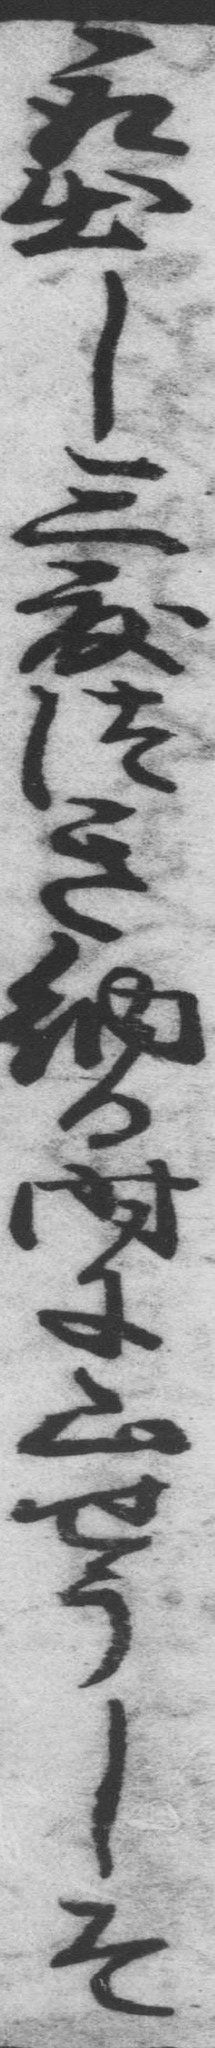取出し三度つき納る時に山せうしそ
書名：料理山海郷
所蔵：大阪府立大学学術情報センター 国文学研究資料館
